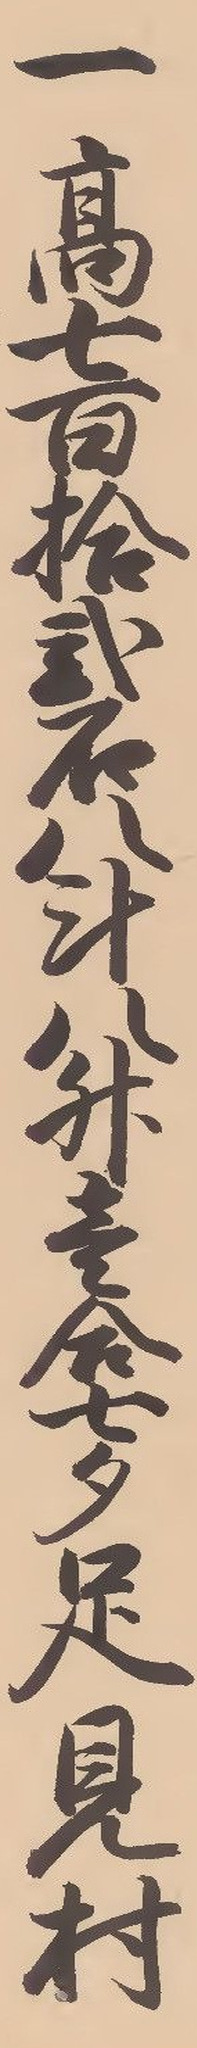一高七百拾弐石八斗八升壱合七勺足見村
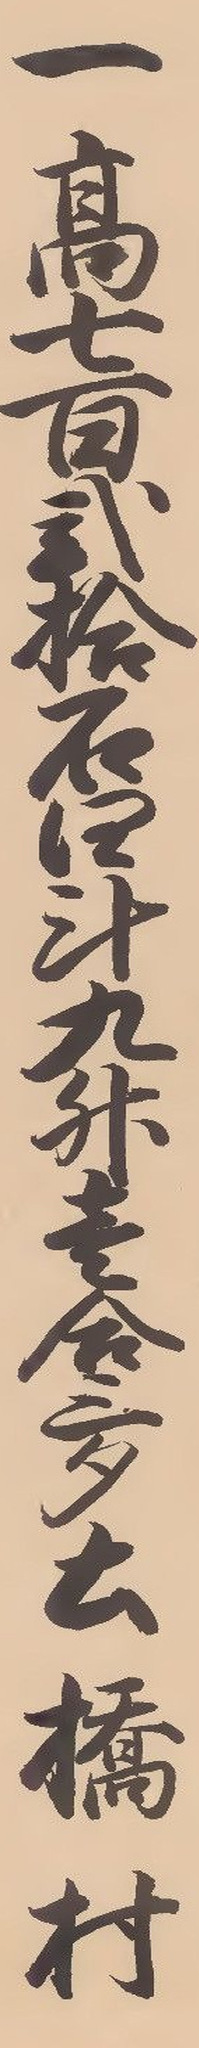一高七百弐拾石四斗九升壱合三勺土橋村
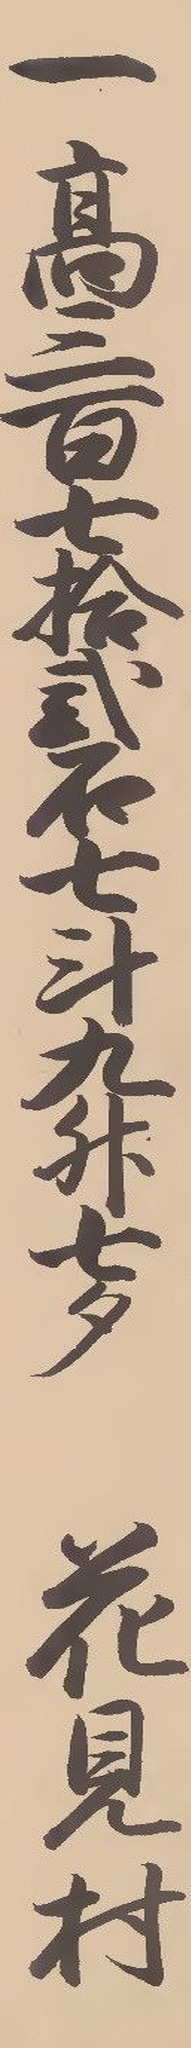一高三百七拾弐石七斗九升七勺花見村
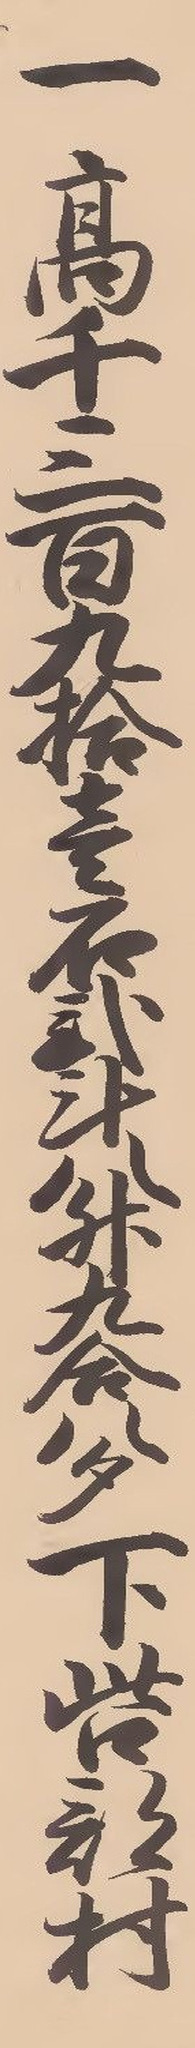一高千三百九拾壱石弐斗八升九合八勺下皆部村
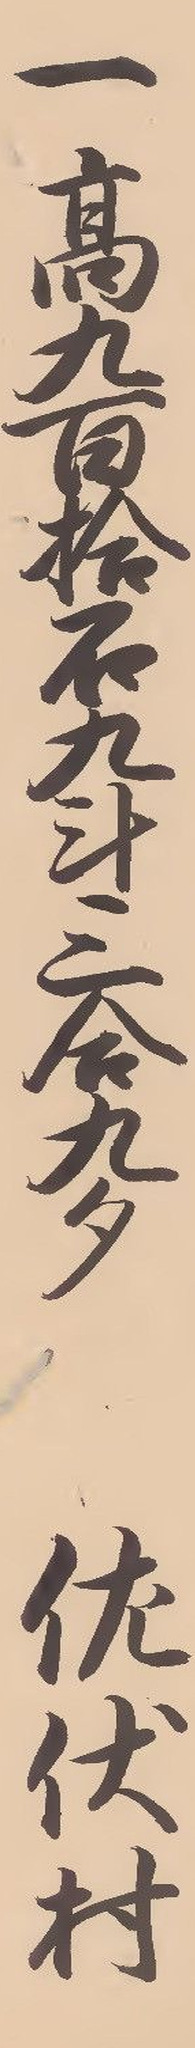一高九百拾石九斗三合九勺佐伏村

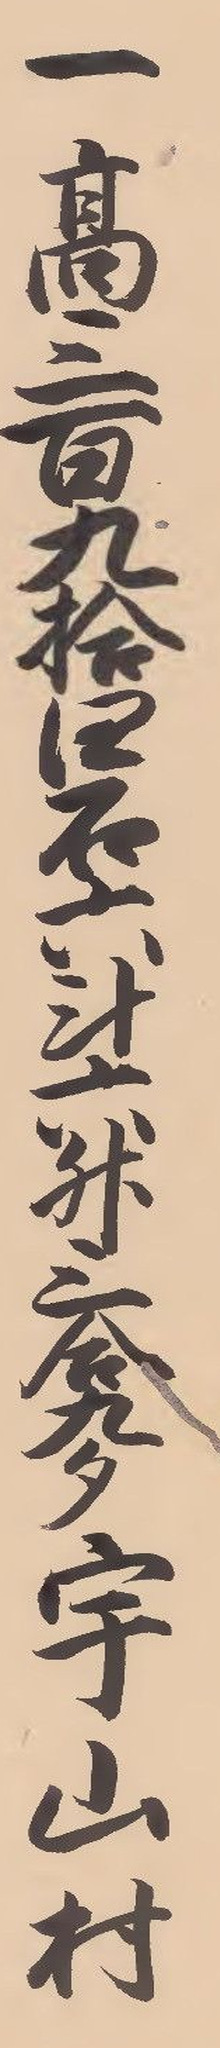一高三百九拾四石六斗六升三合九勺宇山村
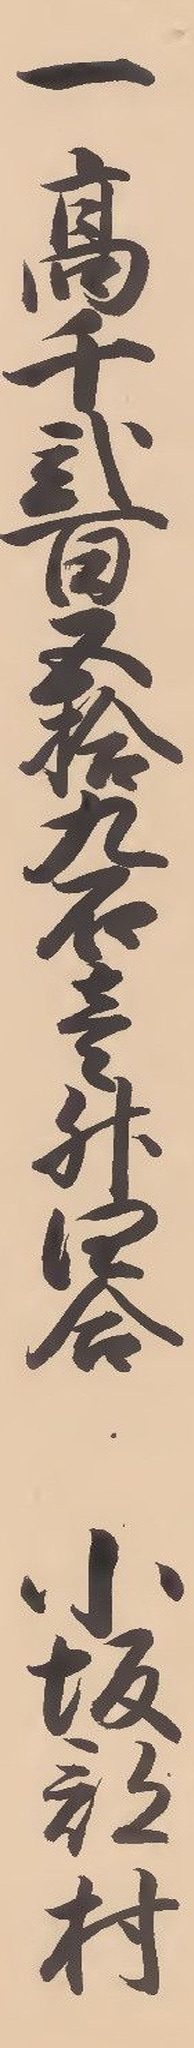一高千弐百五拾九石壱升四合小坂部村
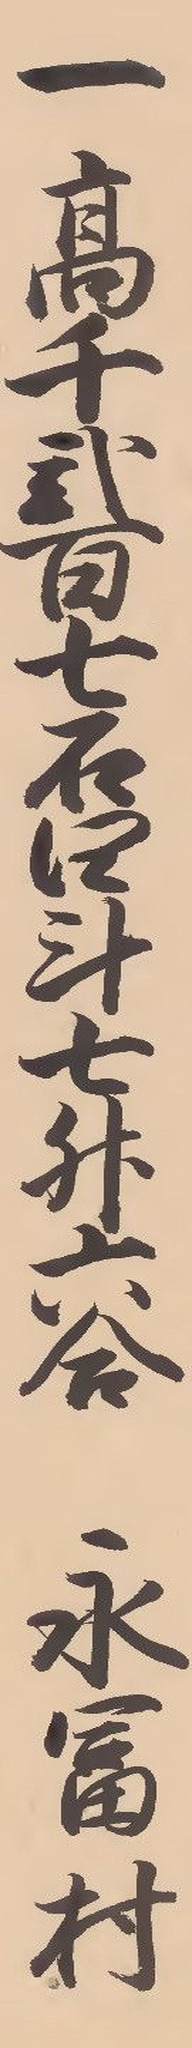一高千弐百七石四斗七升六合永富村
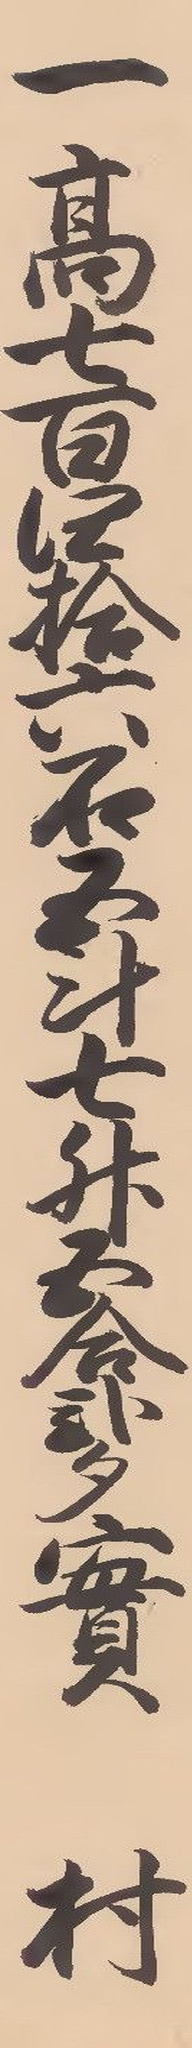一高七百四拾六石五斗七升五合弐尺実村
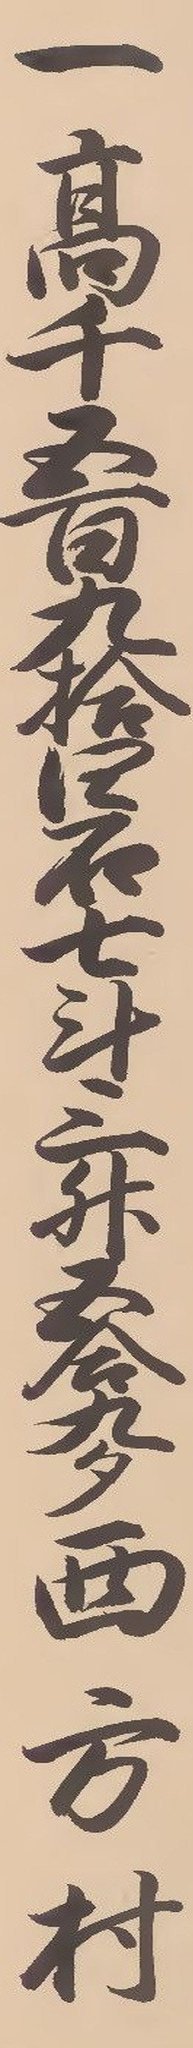一高千五百九拾四石七斗三升五合九勺西方村
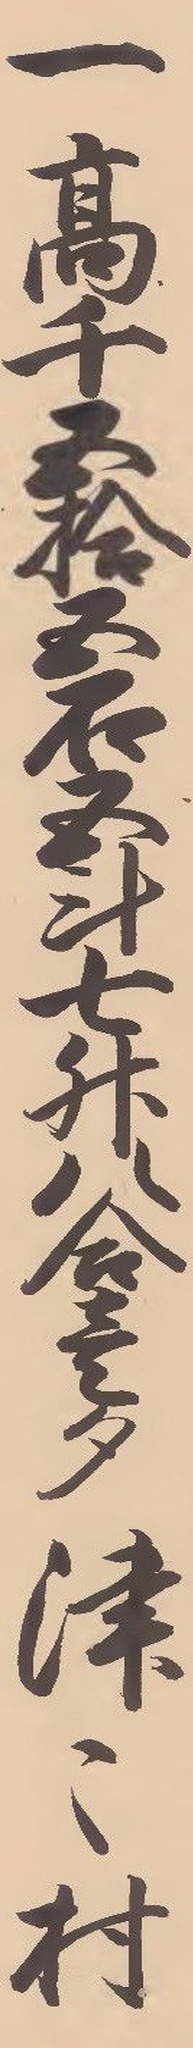一高千五拾五石五斗七升八合壱勺津々村
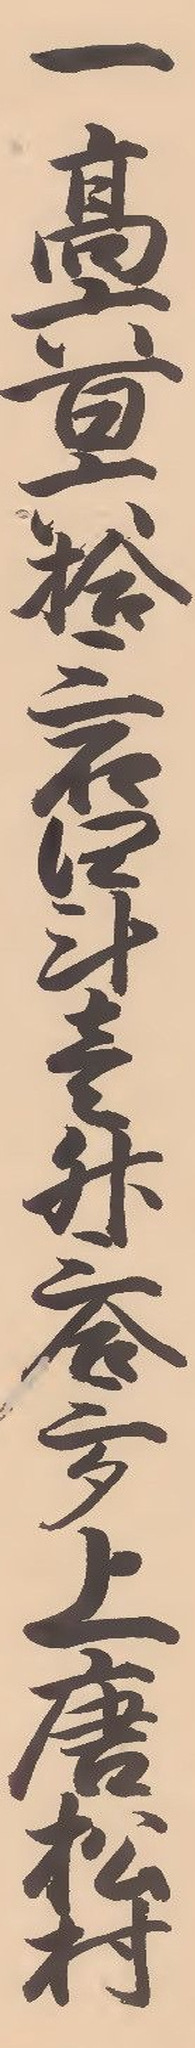一高六百六拾三石四斗壱升三合三勺上唐松村

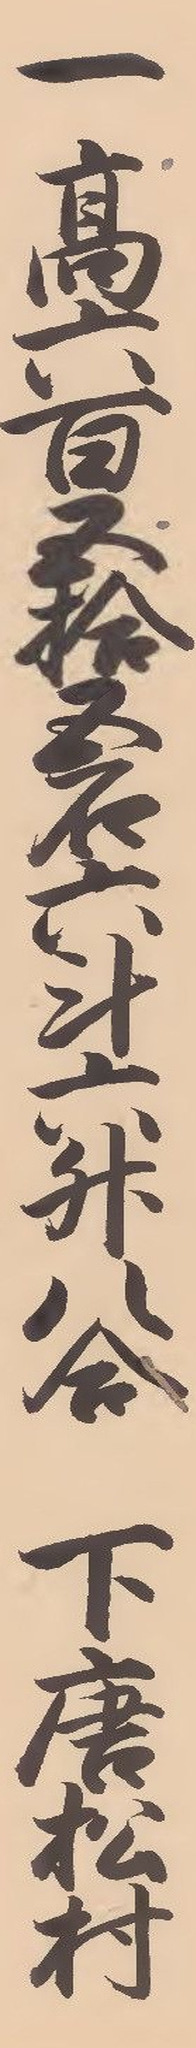一高六百五拾五石六斗六升八合下唐松村
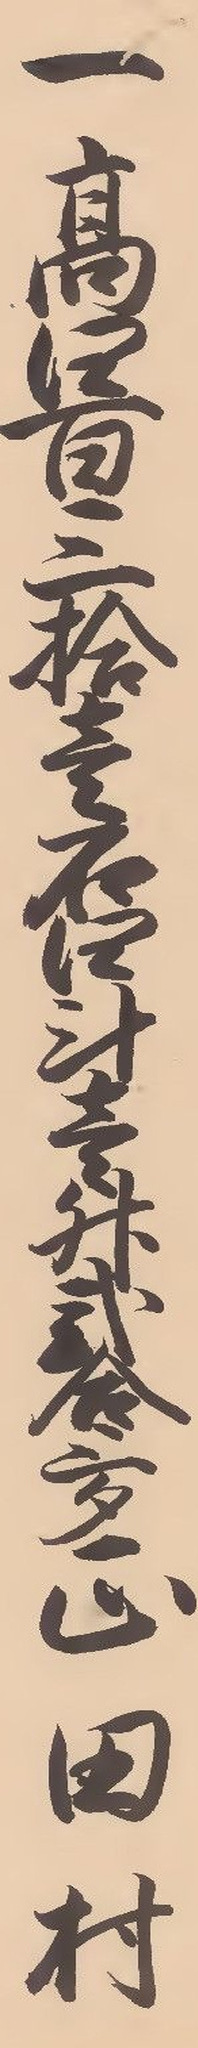一高四百三拾壱石四斗壱升弐合三勺正田村
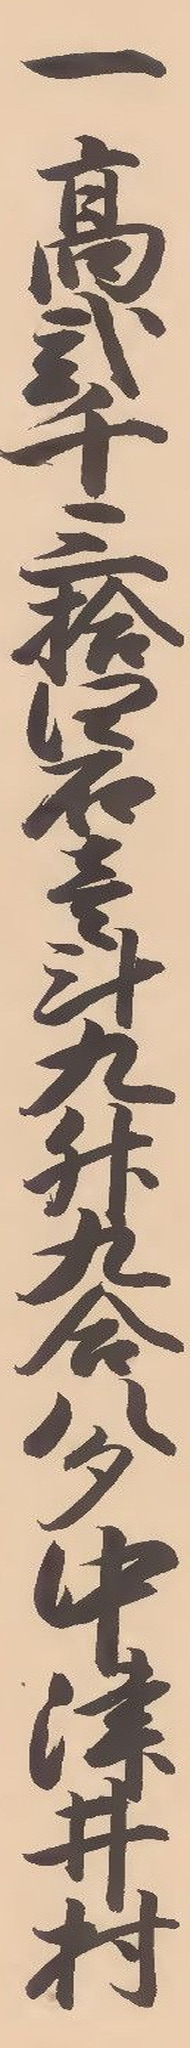一高弐千三拾四石壱斗九升九合八勺中津井村
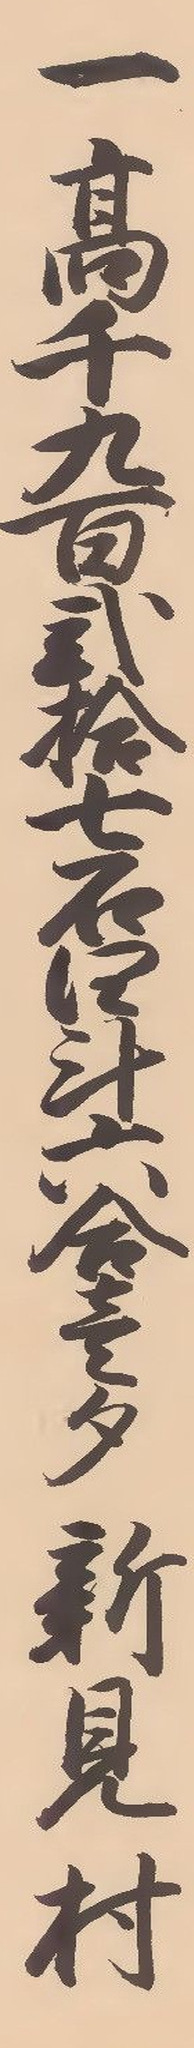一高千九百弐拾七石四斗六合壱勺新見村
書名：備中国郷帳
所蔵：国立公文書館 National Archives of Japan
